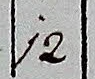12
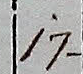17
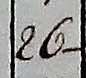26
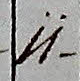11
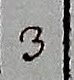3
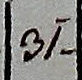31
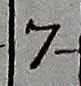7
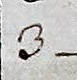3
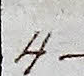4
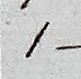1
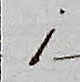1
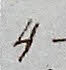4
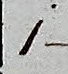1
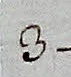3
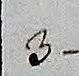3
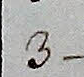3
